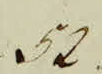52
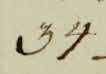34
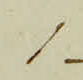1
